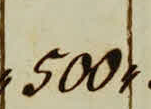500
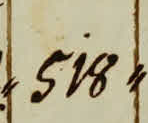518
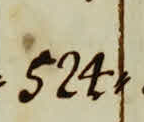524
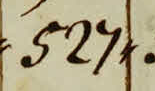527
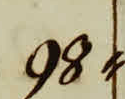98
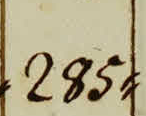285
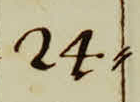24
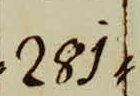281
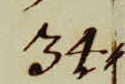34
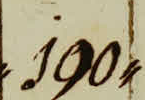190
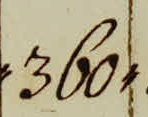360
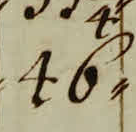46
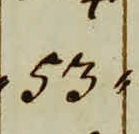53
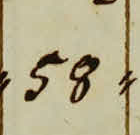58
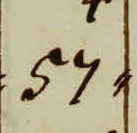57
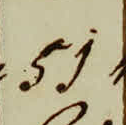51
